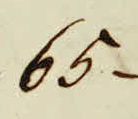65
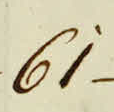61
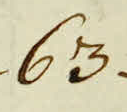63
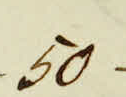50
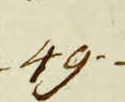49
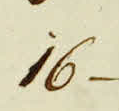16
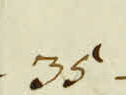35
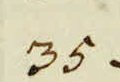35
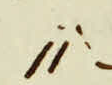11
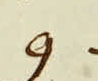9
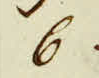6
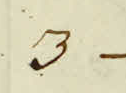3
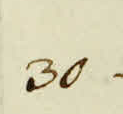30
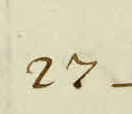27
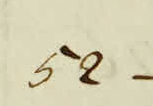52
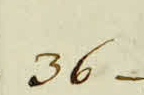36
